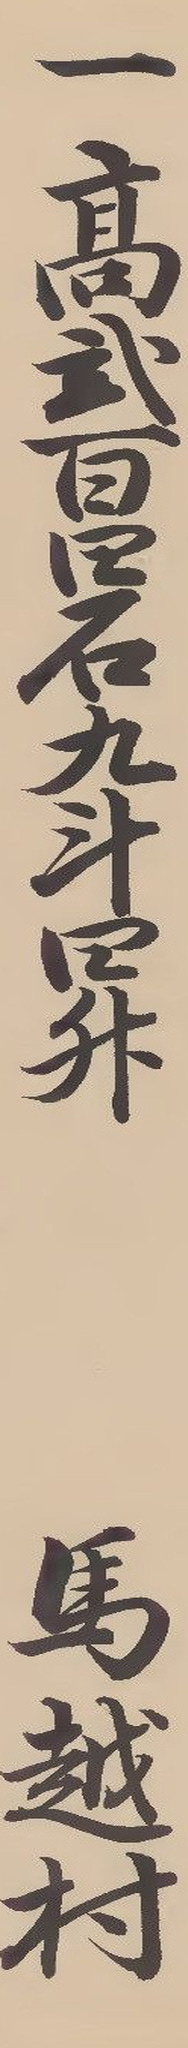一高弐百四石九斗四升馬越村
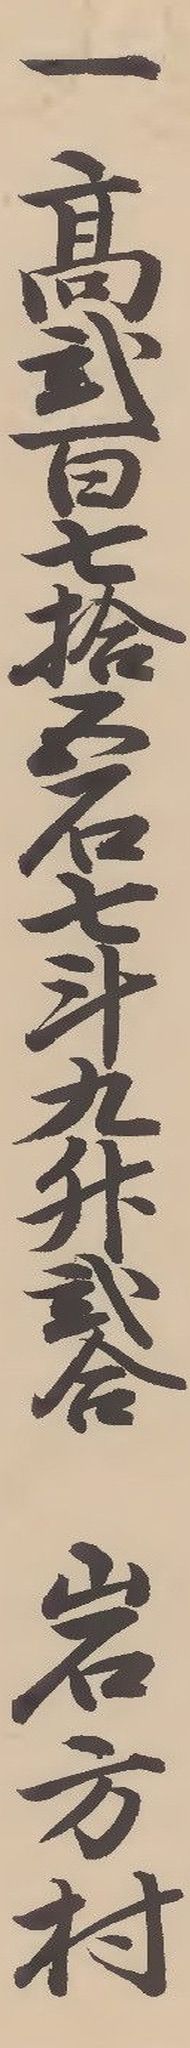一高弐百七拾五石七斗九升弐合岩方村
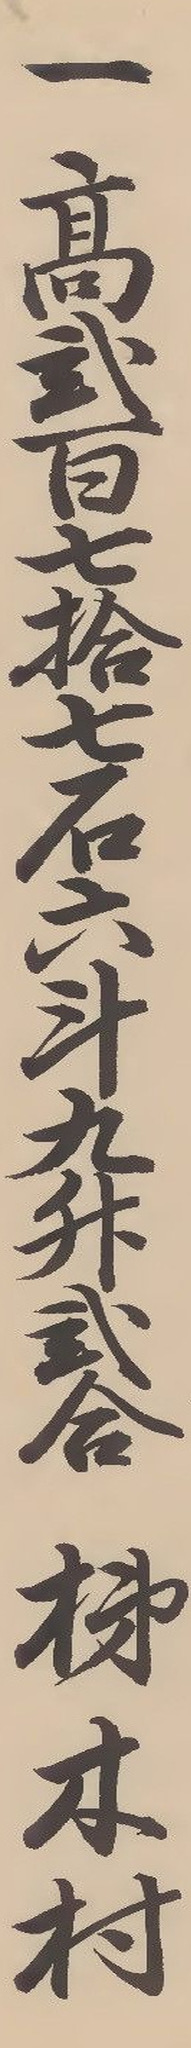一高弐百七拾七石六斗九升弐合柿木村
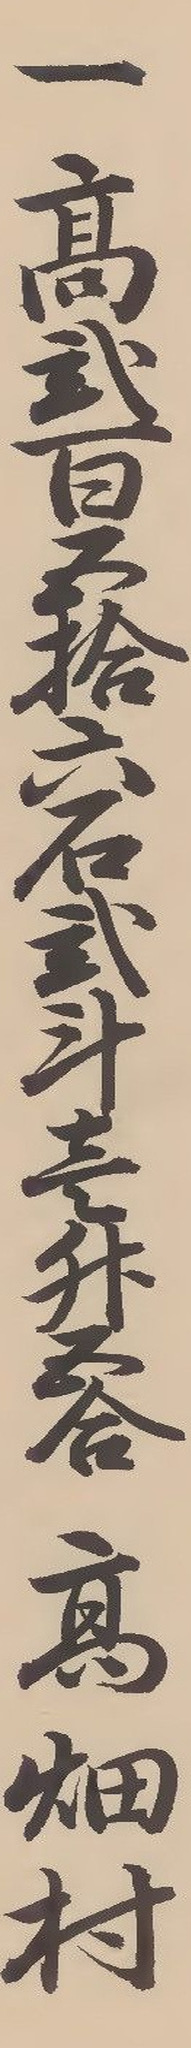一高弐百五拾六石弐斗壱升五合高畑村
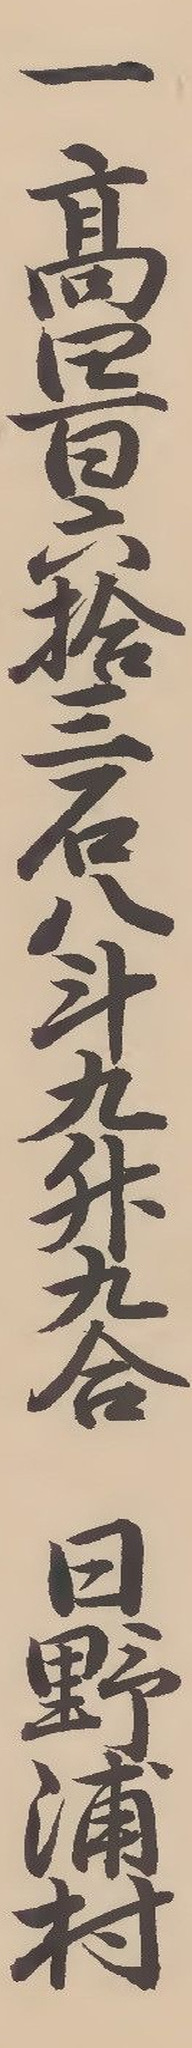一高四百六拾三石八斗九升九合日野浦村

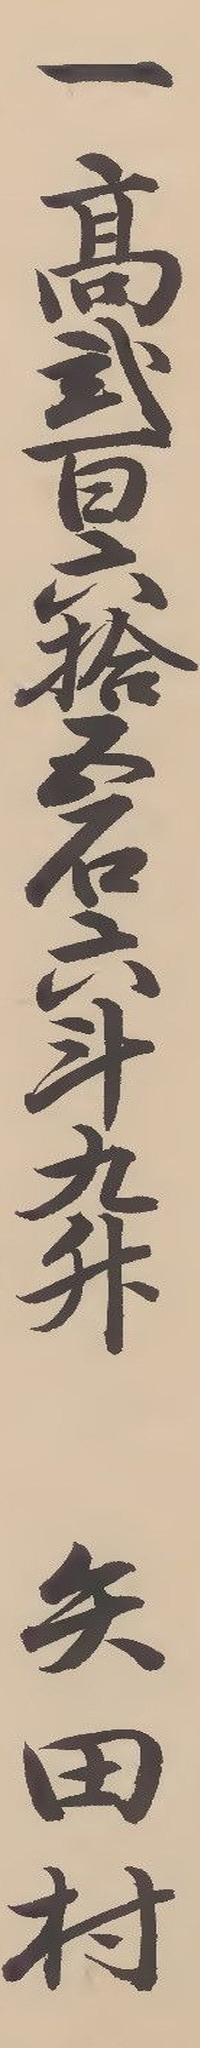一高弐百六拾五石六斗九升矢田村
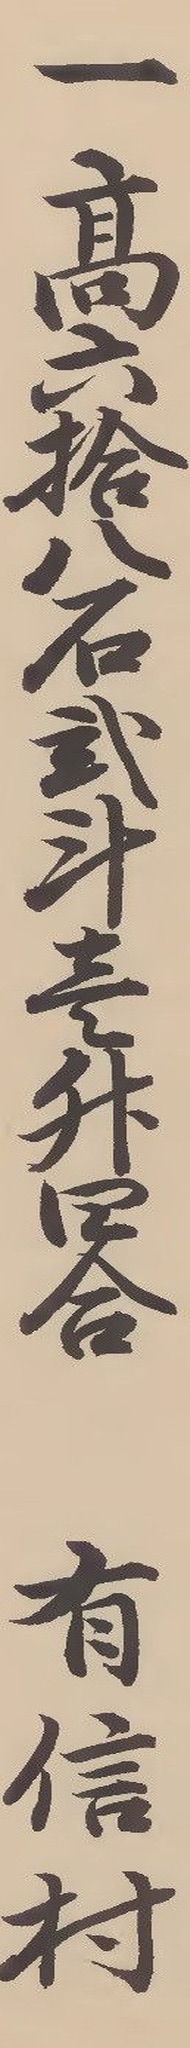一高六拾八石弐斗壱升四合有信村
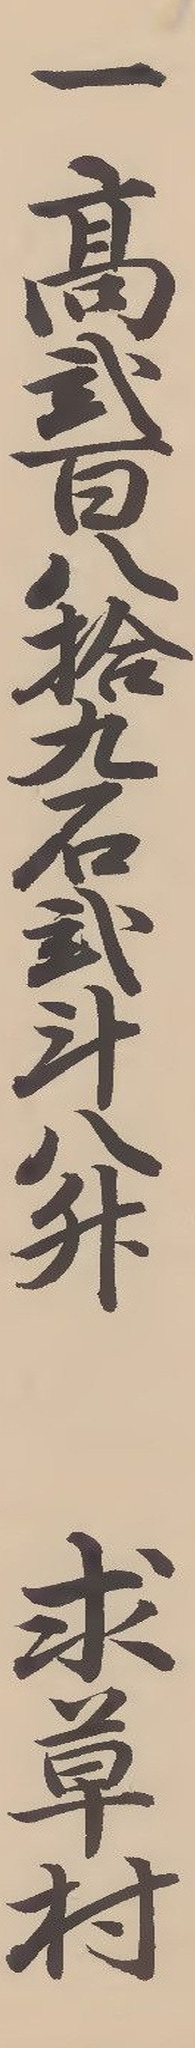一高弐百八拾九石弐斗八升求草村
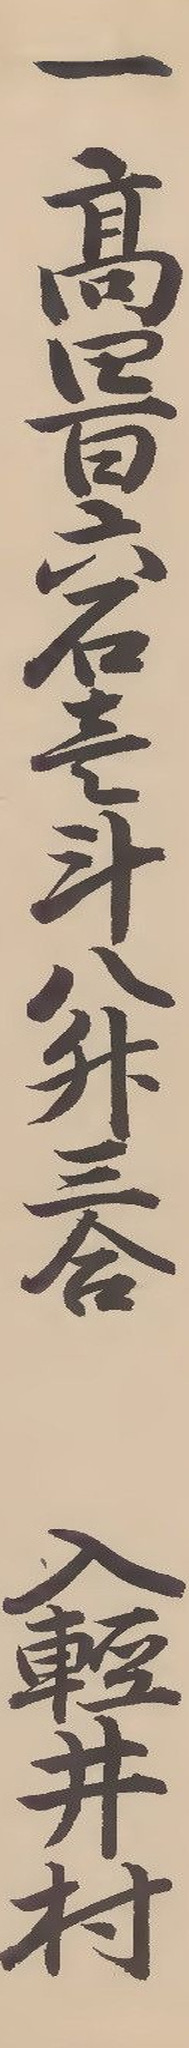一高四百六石壱斗八升三合入軽井村
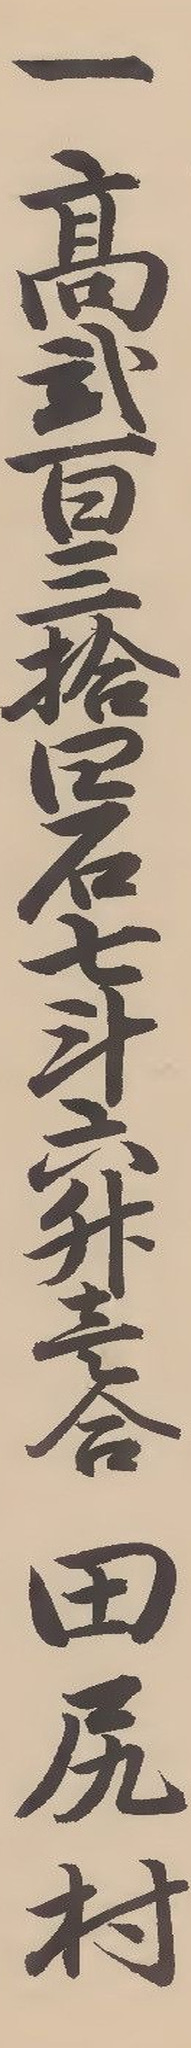一高弐百三拾四石七斗六升壱合田尻村
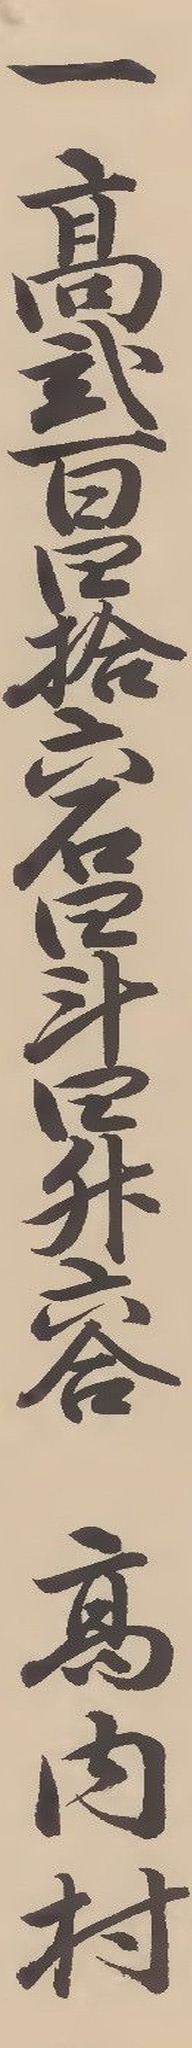一高弐百四拾六石四斗四升六合高内村
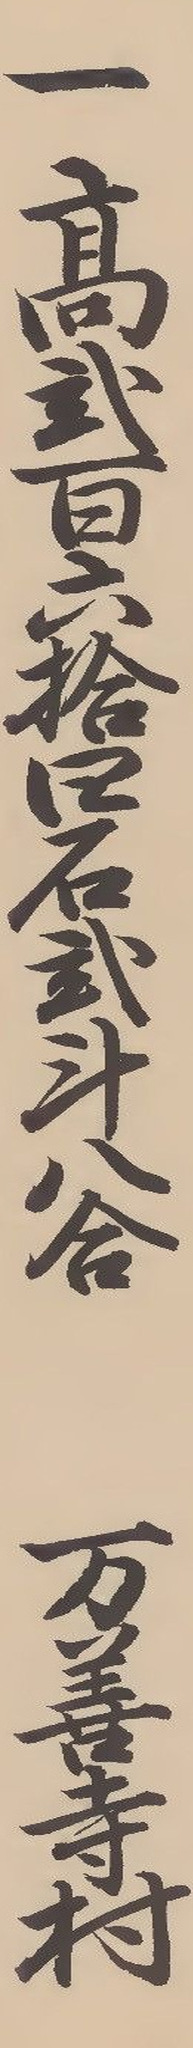一高弐百六拾四石弐斗八合万善寺村
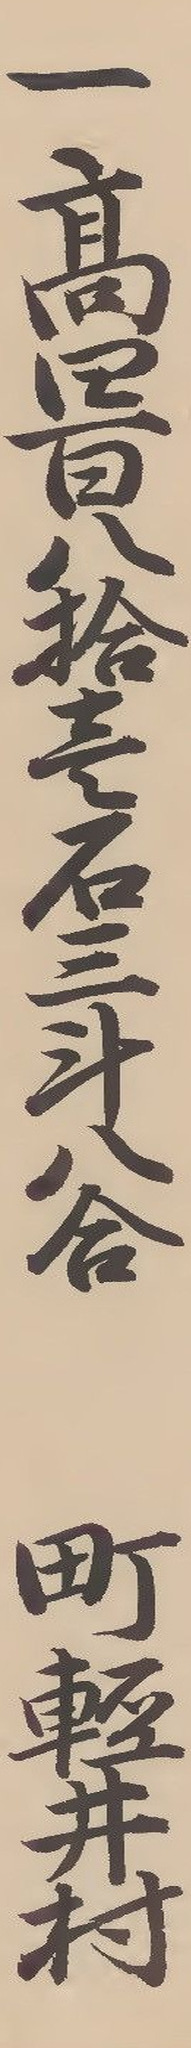一高四百八拾壱石三斗八合町軽井村

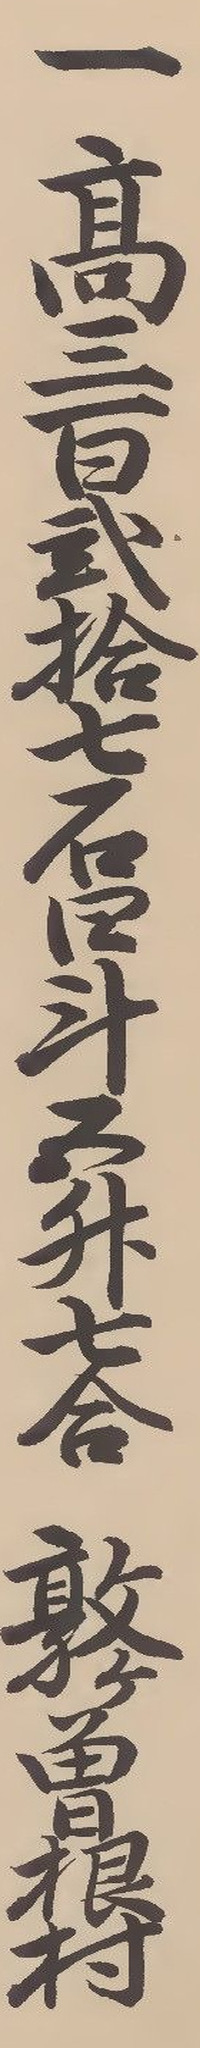一高三百弐拾七石四斗五升七合敦ヶ曽根村
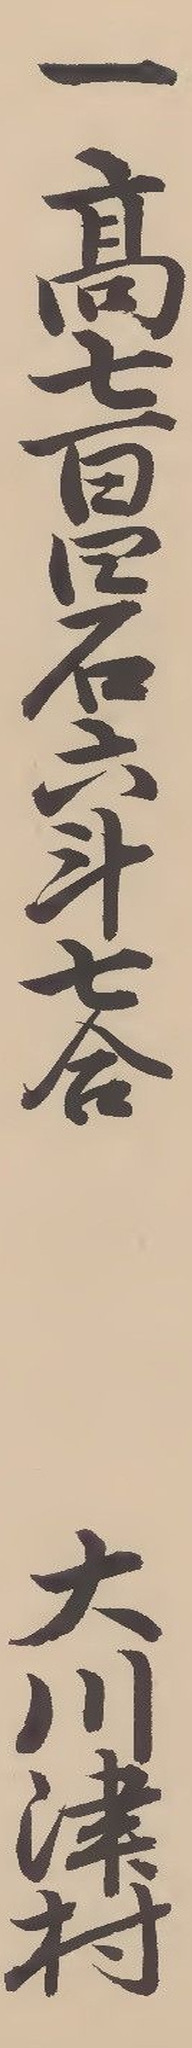一高七百四石六斗七合大川津村
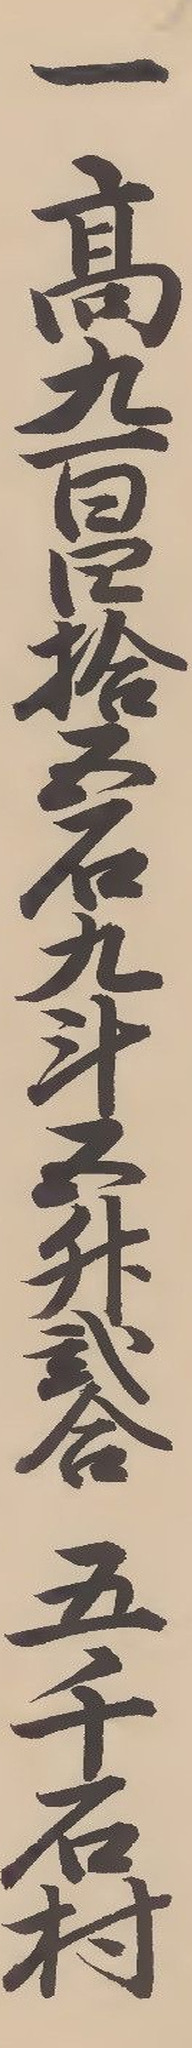一高九百四拾五石九斗五升弐合五千石村
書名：越後国郷帳　中
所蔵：国立公文書館 National Archives of Japan
